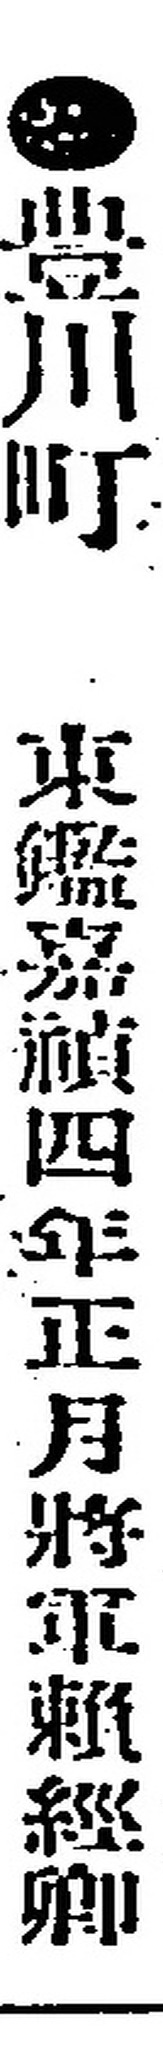●豊川町東鑑嘉禎四年正月将軍頼経卿
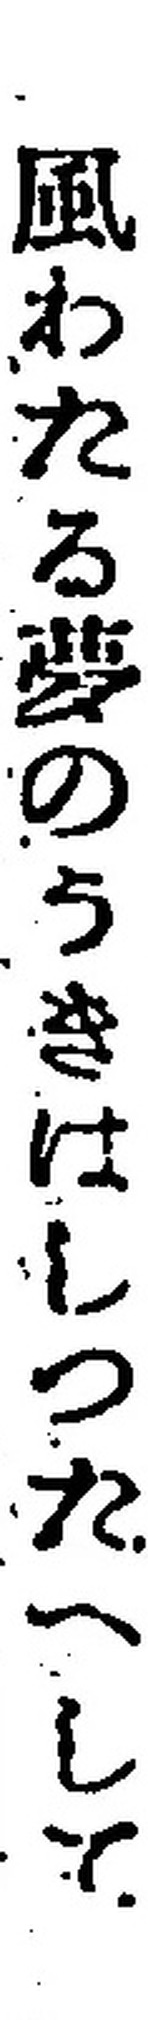風わたる夢のうきはしつたへして
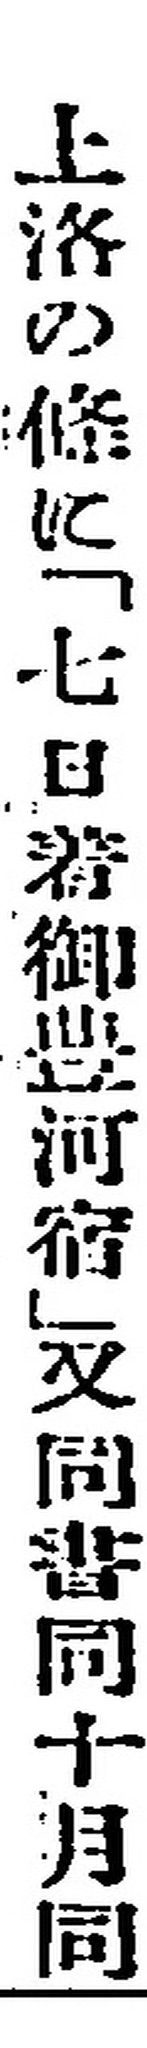上洛の条に「七日着御豊河宿」又同書同十月同
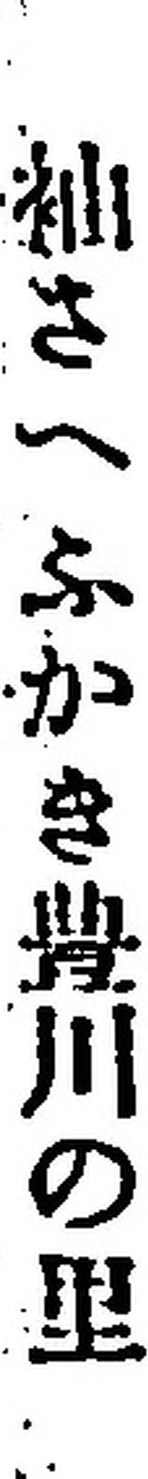袖さへふかき豊川の里
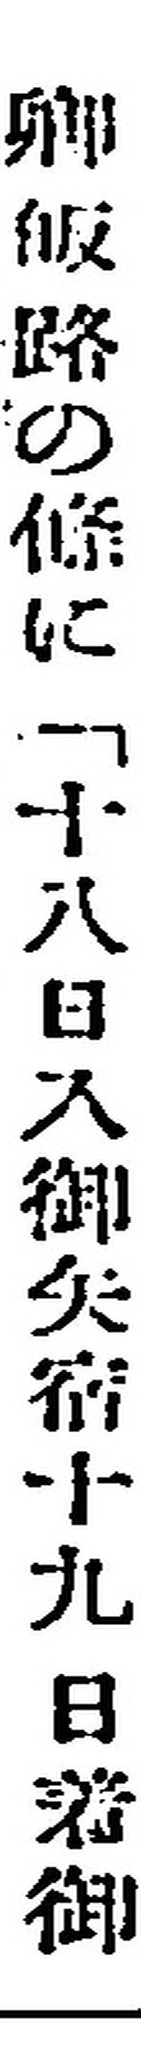卿皈路の条に「十八日入御矢宿十九日着御
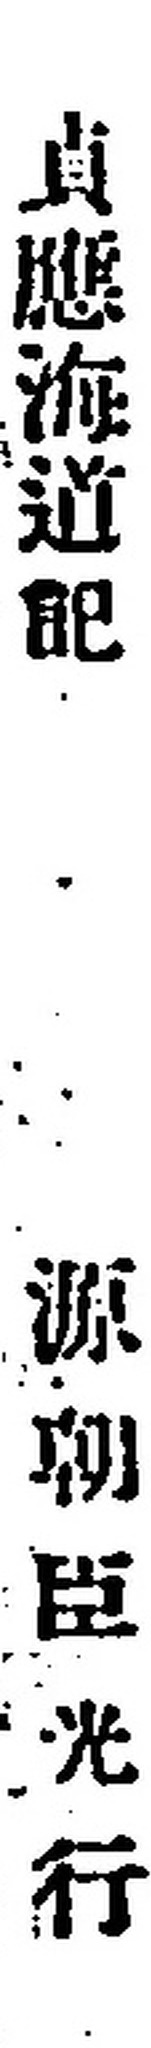貞応海道記源朝臣光行
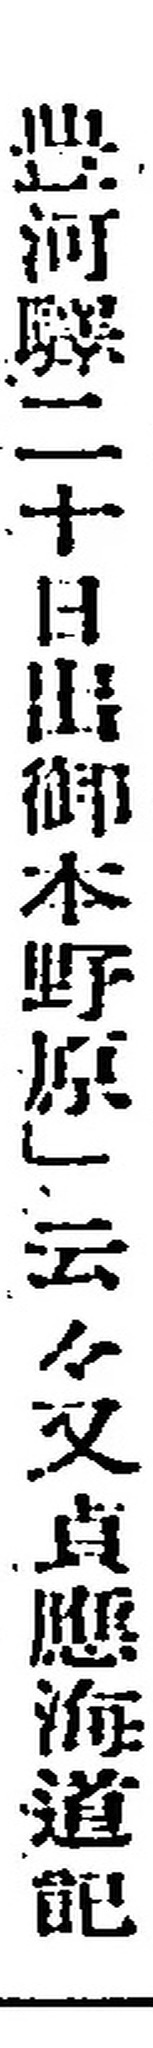豊河駅二十日出御本野原」云々又貞応海道記
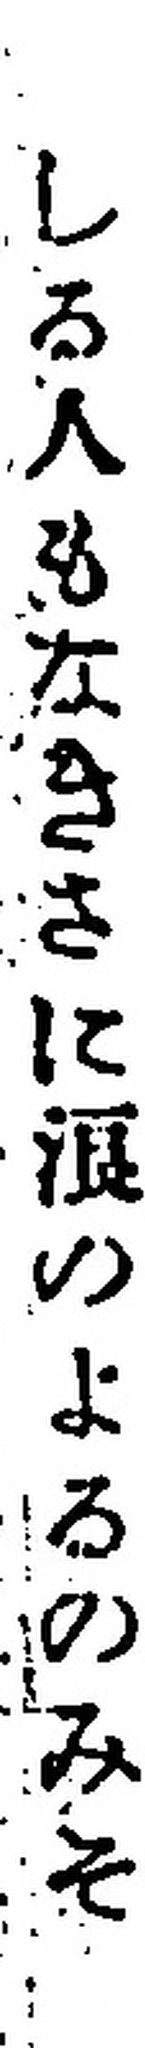しる人もなきさに浪のよるのみそ
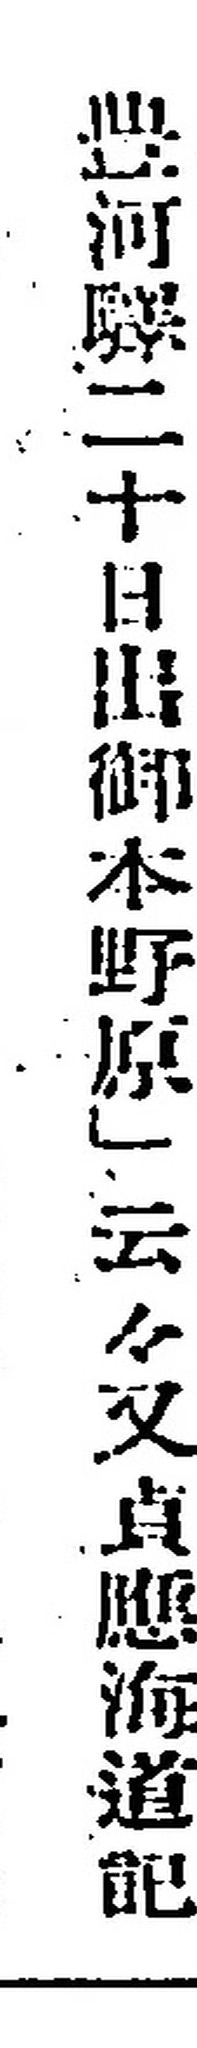豊河駅二十日出御本野原」云々又貞応海道記
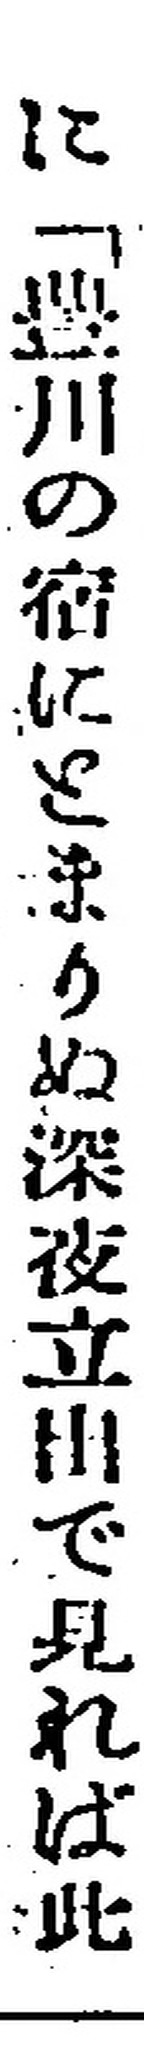に「豊川の宿にとまりぬ深夜立出で見れば此
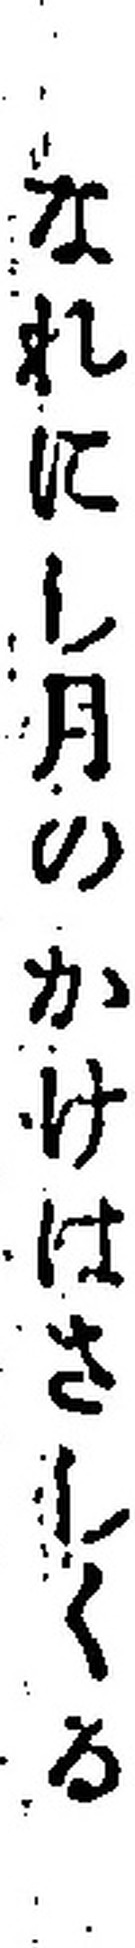なれにし月のかけはさしくる
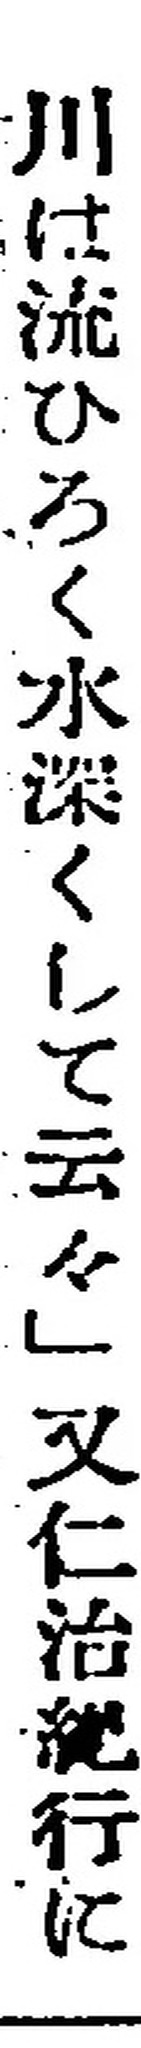川は流ひろく水深くして云々」又仁治紀行に
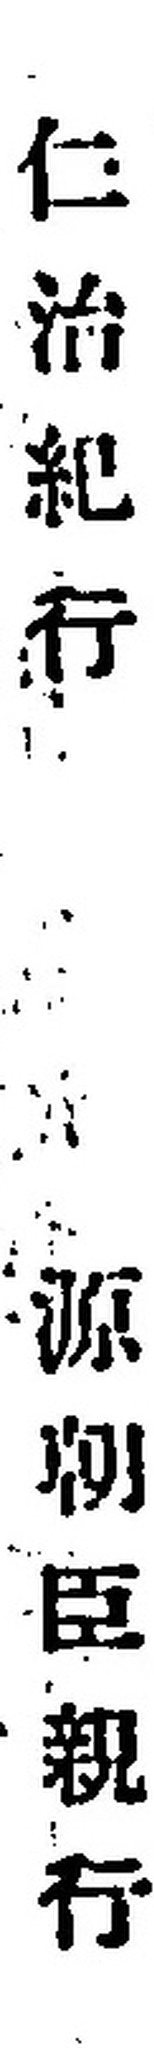仁治紀行源朝臣光行
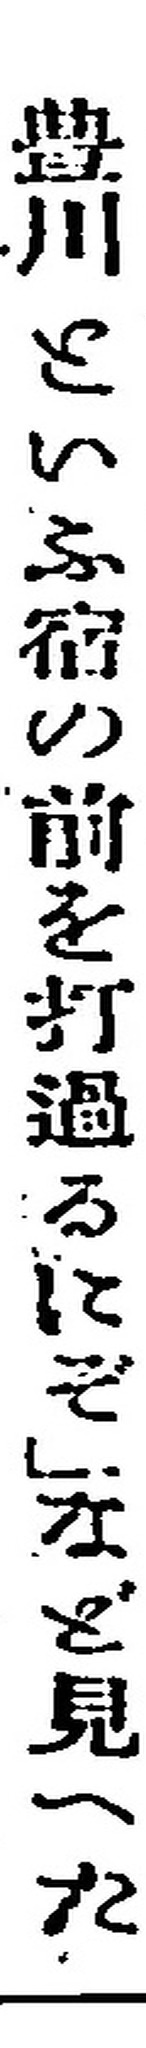豊川といふ宿の前を打過るにぞ」など見へた
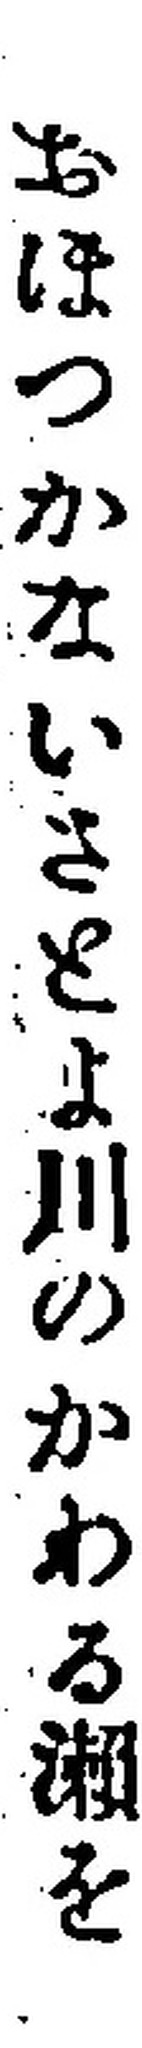おほつかないさとよ川のかわる瀬を
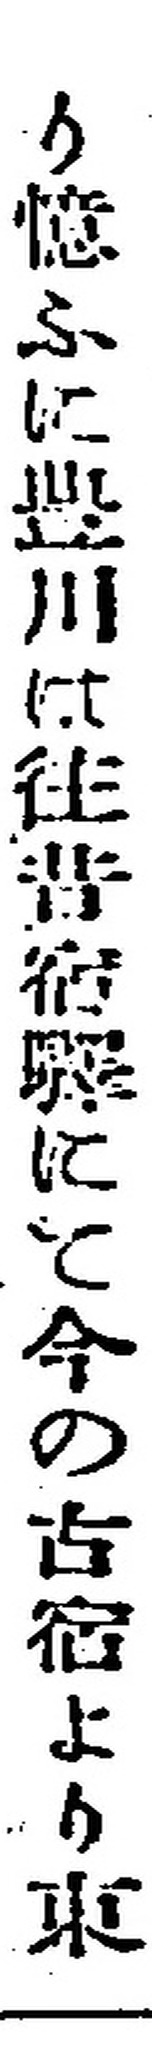り憶ふに豊川は往昔宿駅にて今の古宿より東
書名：東参名勝案内
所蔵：国立国会図書館 National Diet Library, JAPAN
